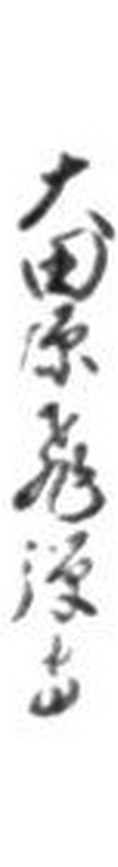同大田原飛騨守
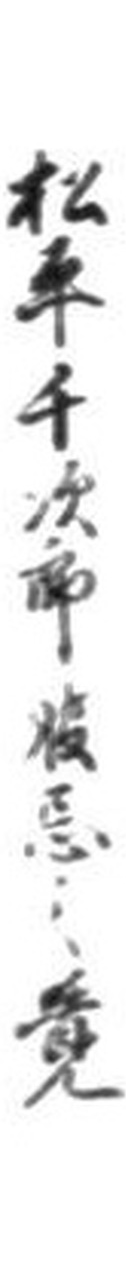松平千次郎服忌之覚
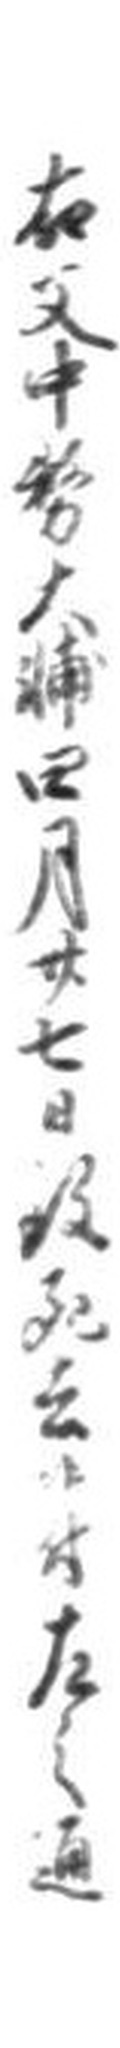右父中務大輔四月廿七日致死去候付左之通
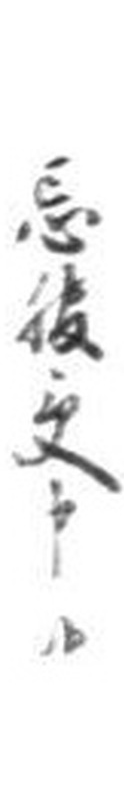忌服受申候
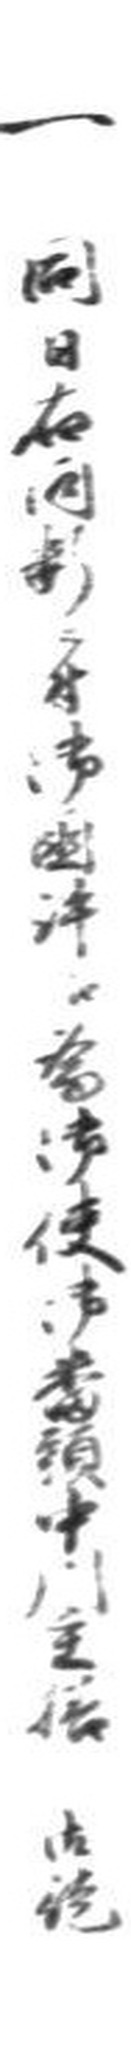一同日右同断ニ付御国許江為御使御番頭中川主膳御徒
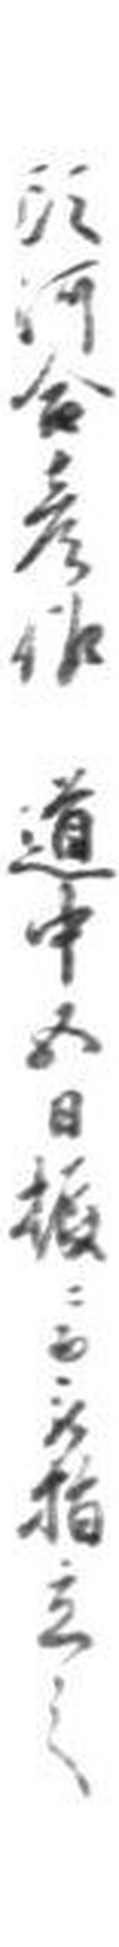頭河合彦作道中五日振ニ而被指立之

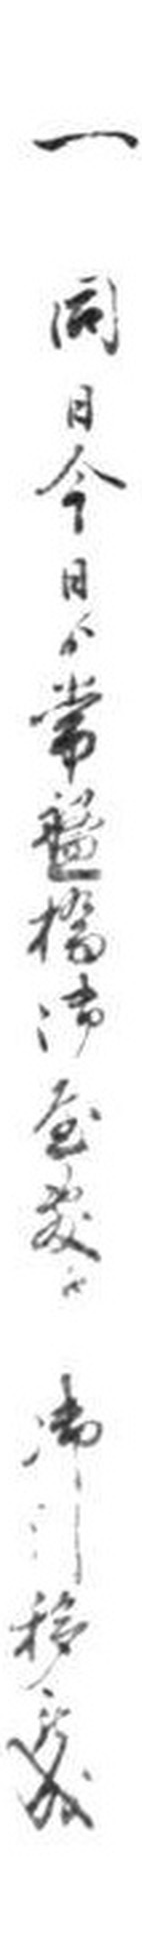一同日今日ゟ常盤橋御屋敷江御引移被成
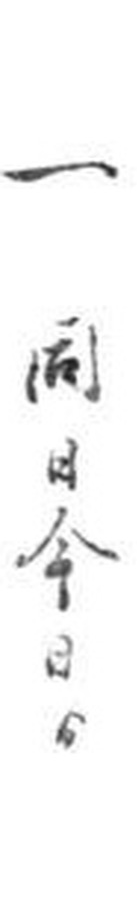一同日今日ゟ
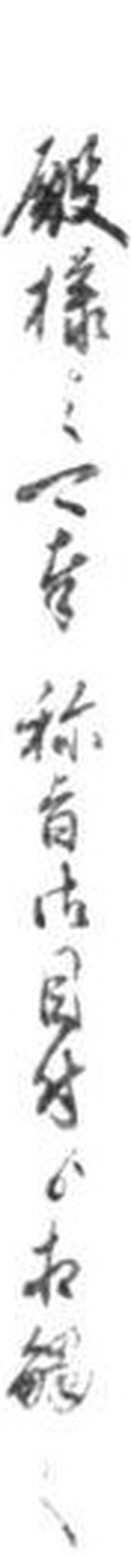殿様と可奉称旨御目付ゟ相触之
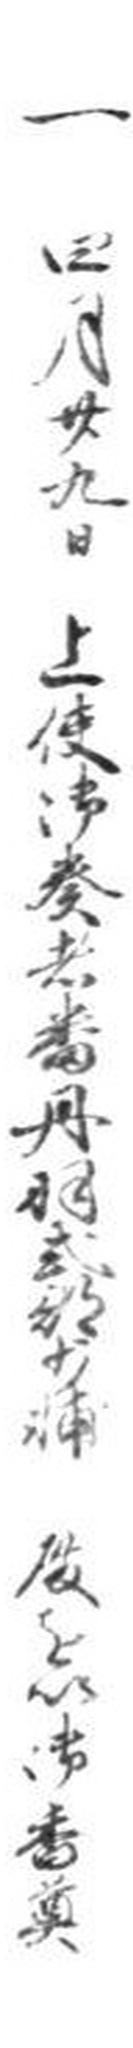一四月廿九日上使御奏者番丹羽式部少輔殿を以御香奠
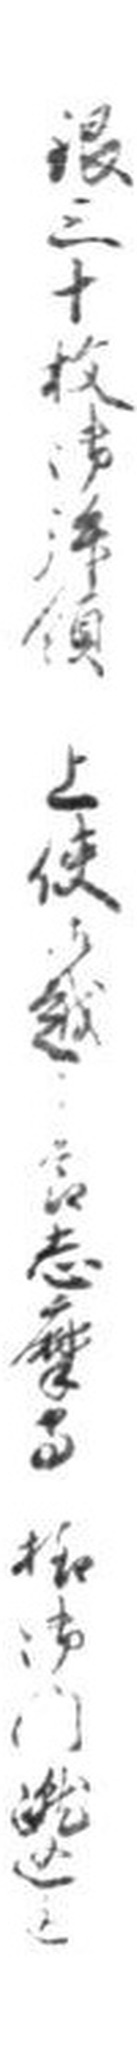銀三十枚御拝領上使御越之節志摩守様御門蹴込迄
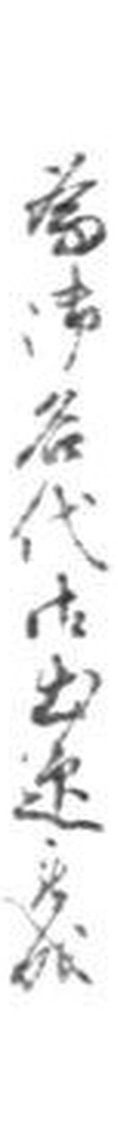為御名代御出迎被成
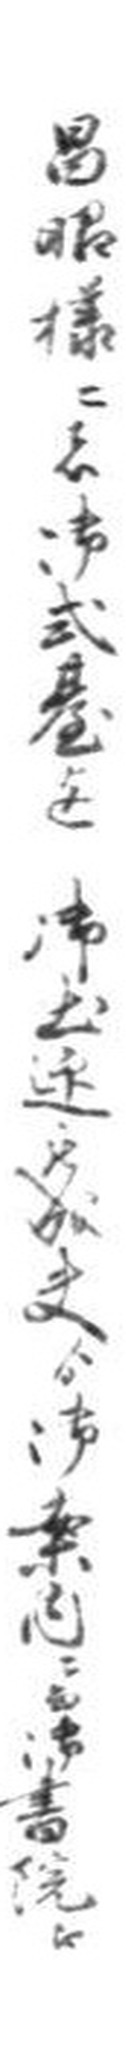昌昭様ニ者御式台迄御出迎被成夫ゟ御案内ニ而御書院江
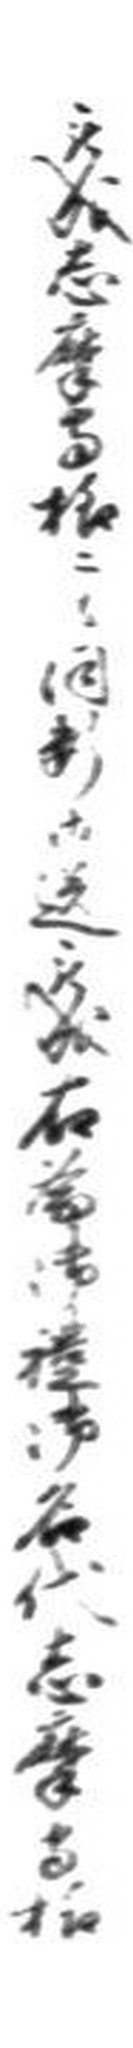被成志摩守様ニも同断御送被成右為御礼御名代志摩守様
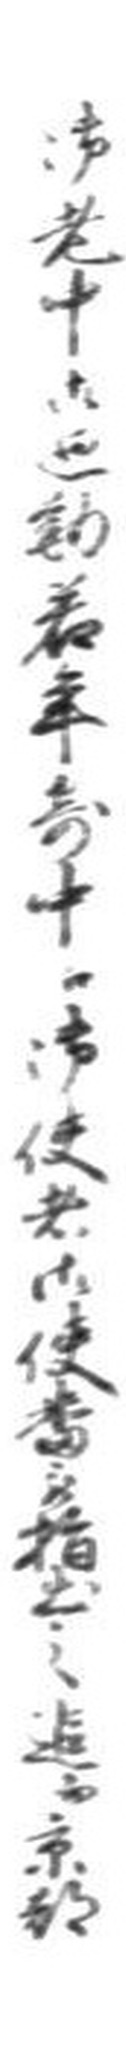御老中御廻勤若年寄中江御使者御使番被指出之追而京都
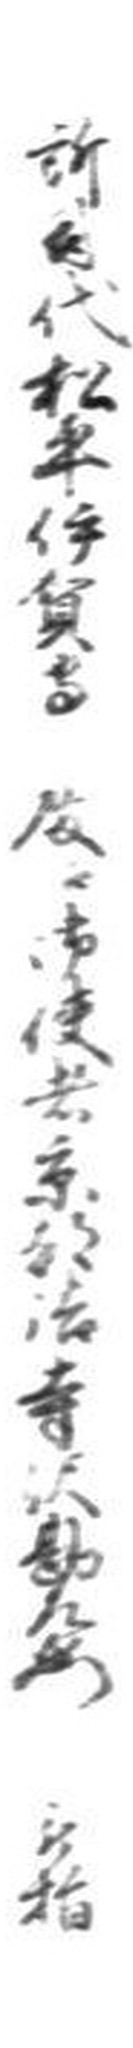所司代松平伊賀守殿江御使者京都詰寺沢勘左衛門被指
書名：家譜 三十七 宗矩公 従正徳五年到享保九年五月
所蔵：福井県文書館 Fukui Prefectural Archives
